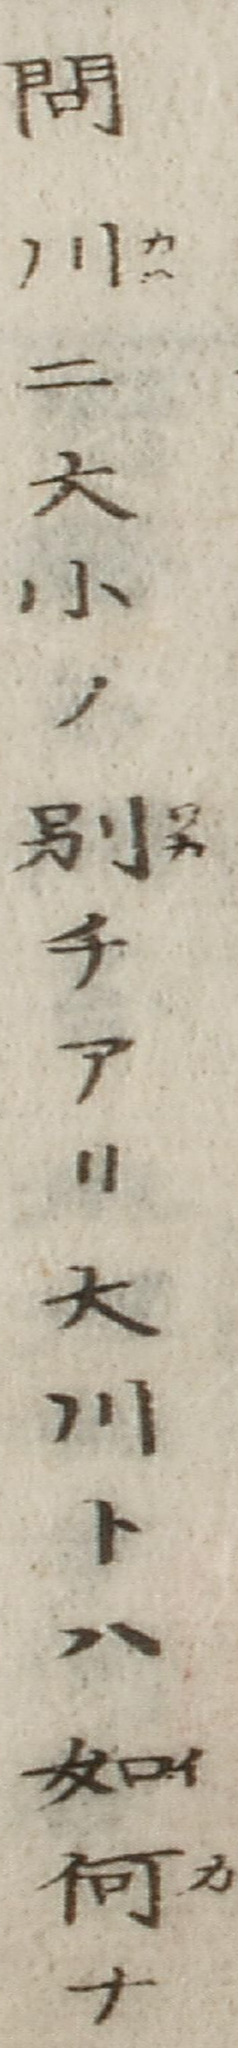問川ニ大小ノ別チアリ大川トハ如何ナ
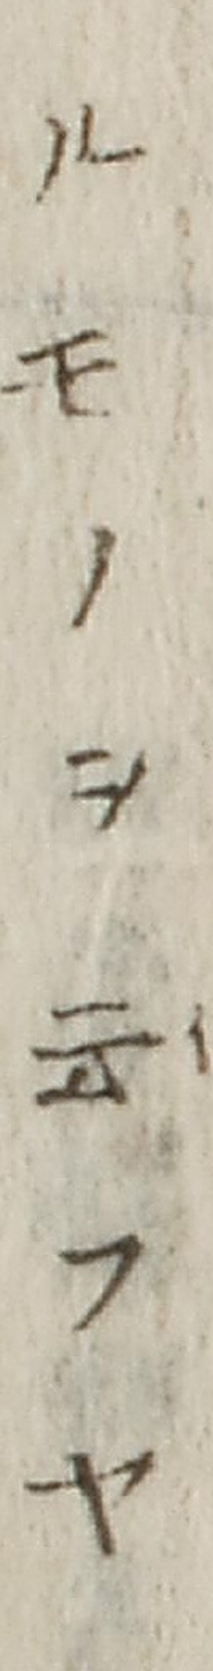ルモノヲ云フヤ
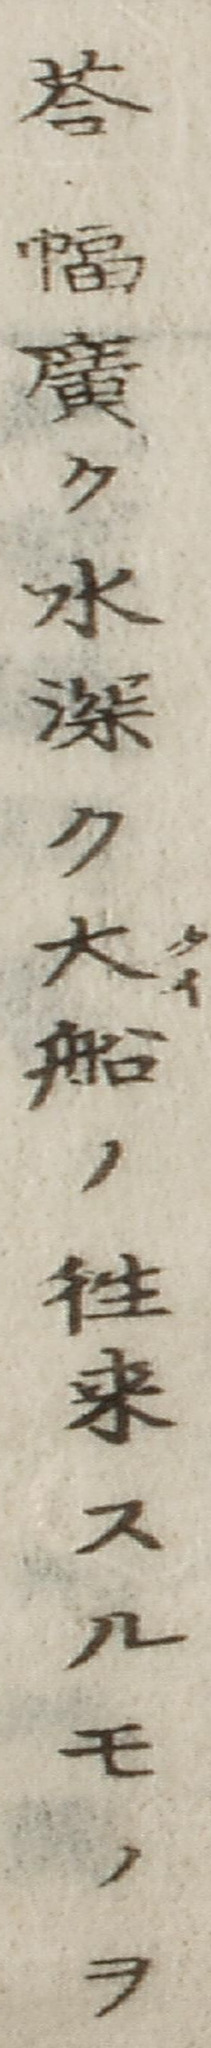答幅廣ク水深ク大船ノ往来スルモノヲ
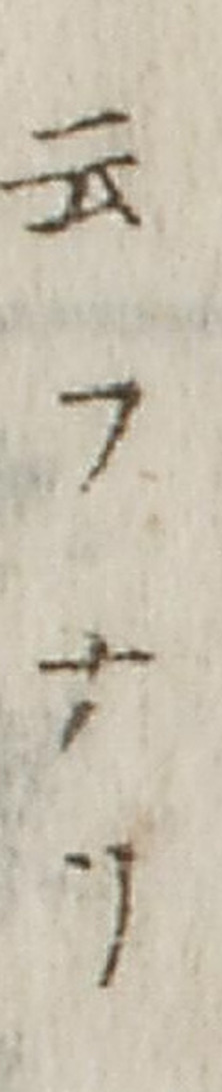云フナリ
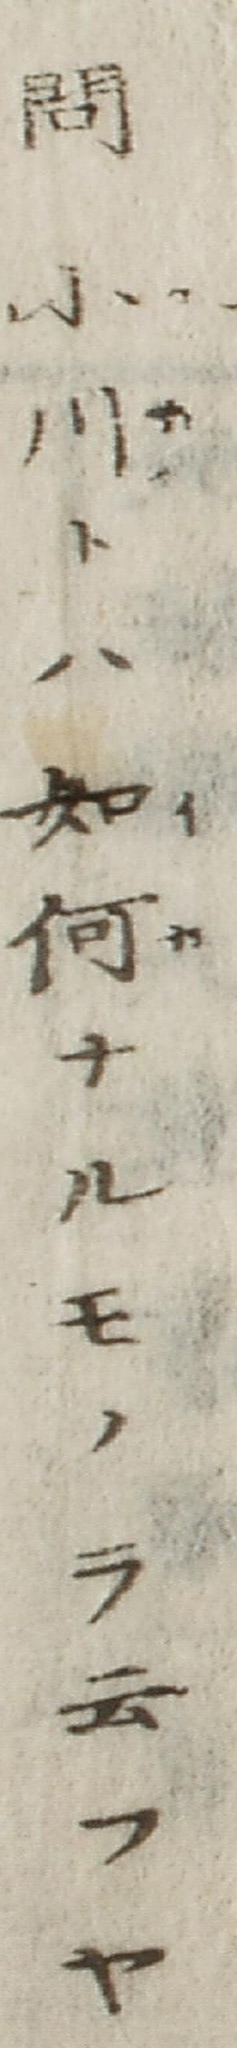問小川トハ如何ナルモノヲ云フヤ
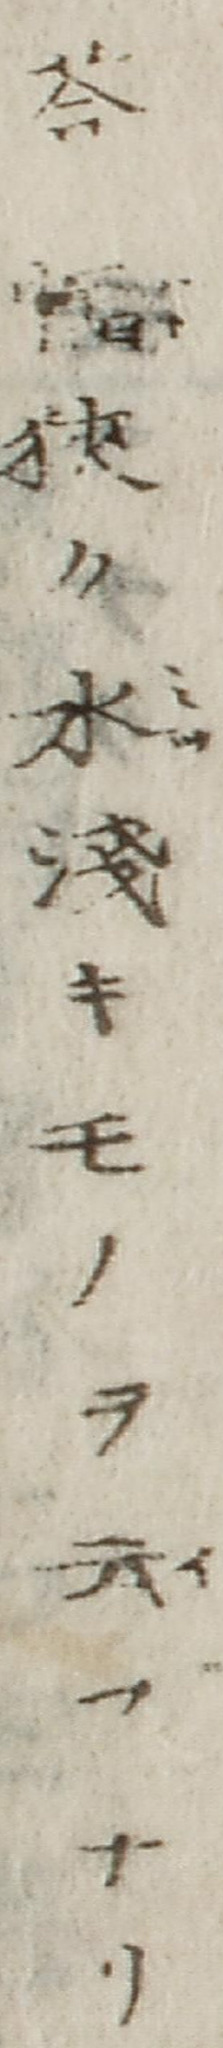答幅狭ク水浅キモノヲ云フナリ
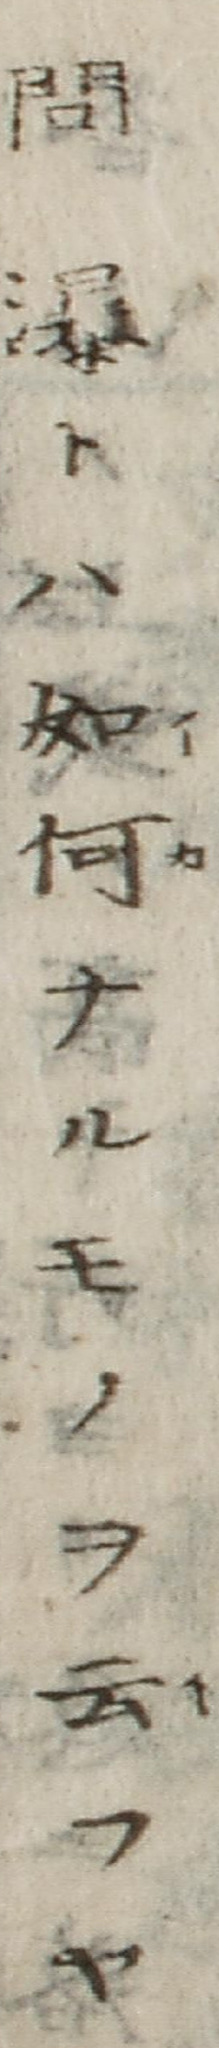問瀑トハ如何ナルモノヲ云フヤ

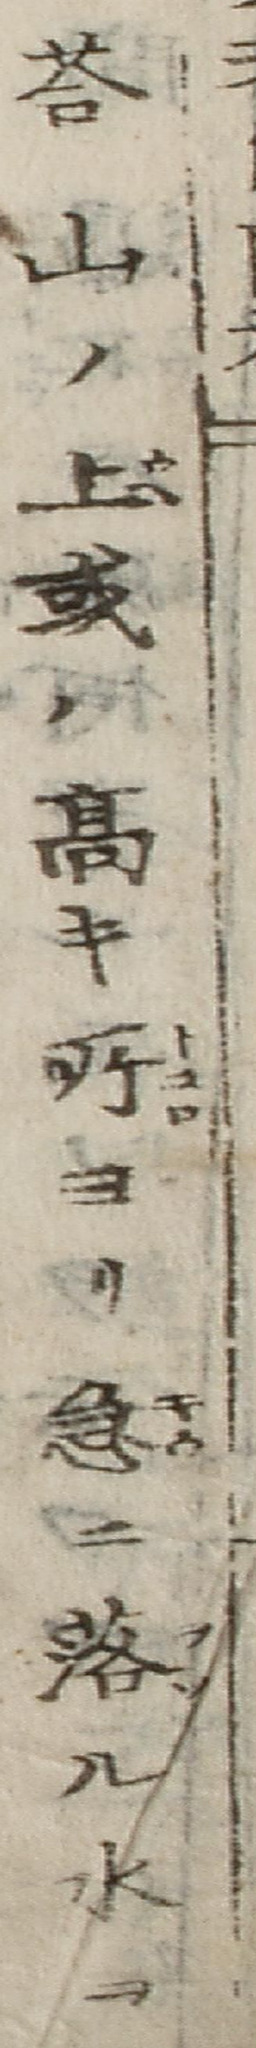答山ノ上或、髙キ所ヨリ急二落ル水ヲ
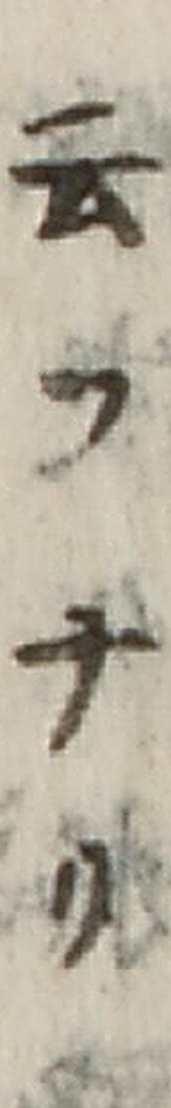云フナリ
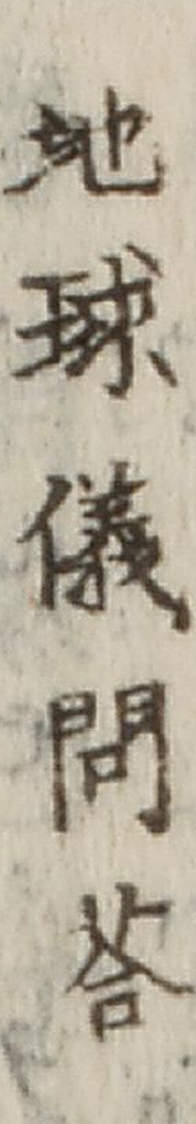地球儀問答
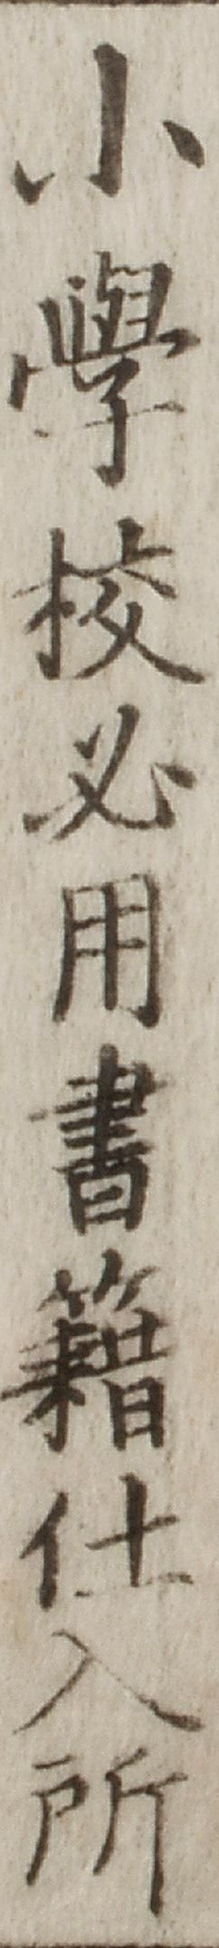小学校必用書籍仕入所
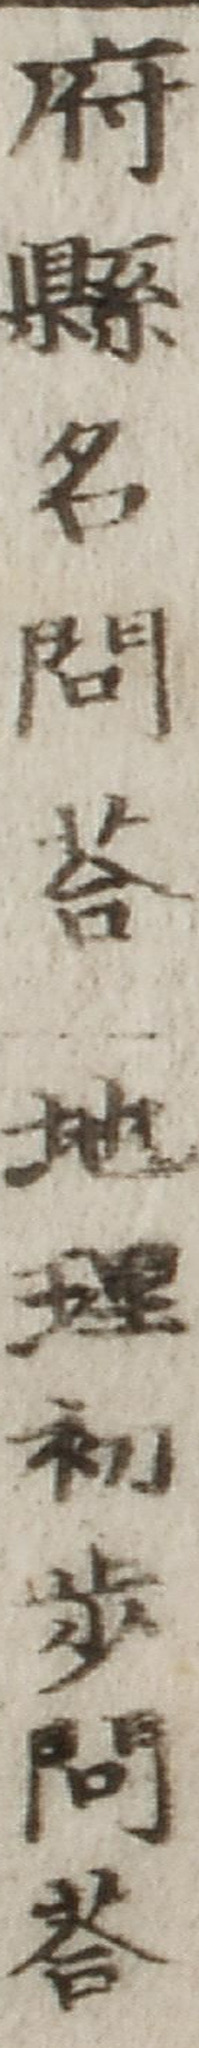府県名問答地理初歩問答
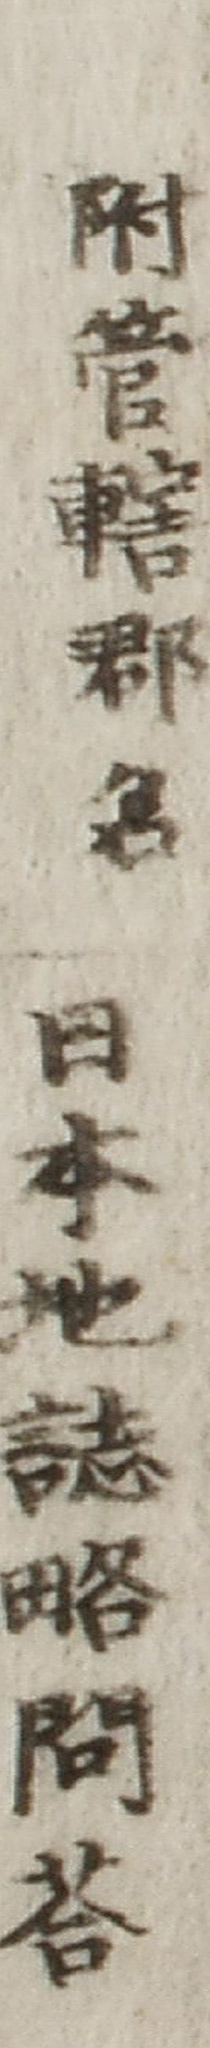附管轄郡名日本地誌略問答
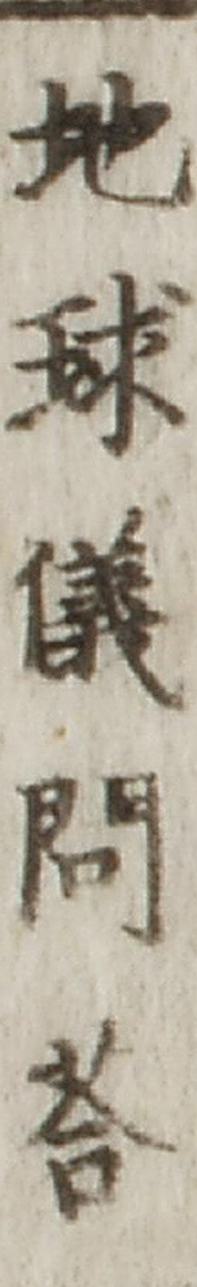地球儀問答
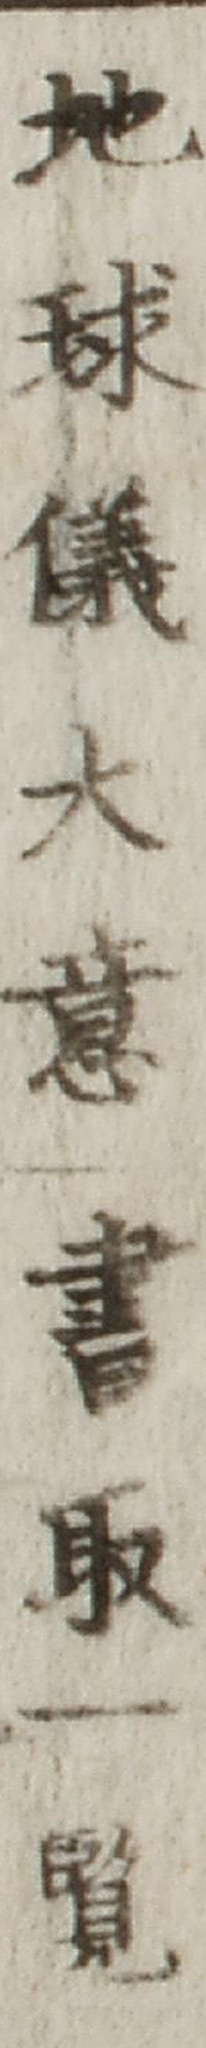地球儀大意書取一覧
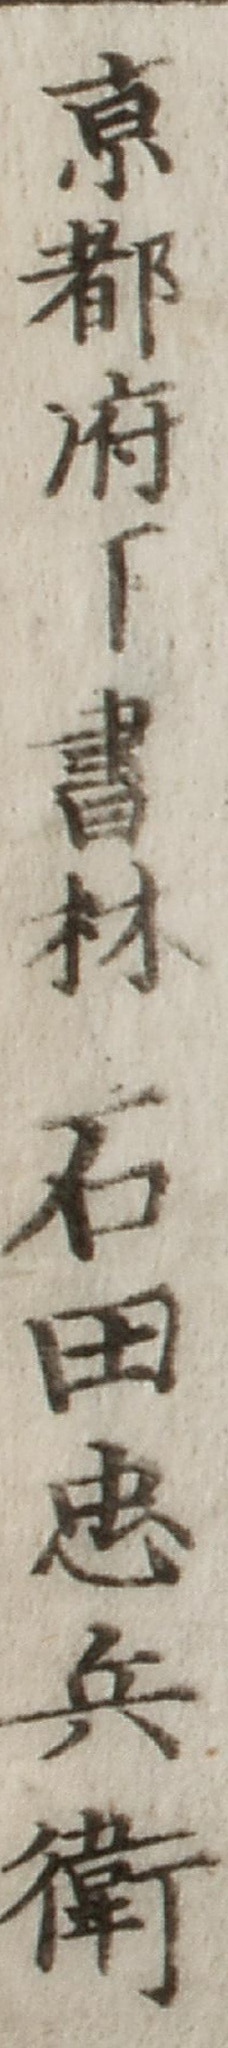京都府書林石田忠兵衛
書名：地球儀問答　全
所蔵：東京大学地震研究所図書室 Earthquake Research Institute Library, The University of Tokyo, JAPAN
